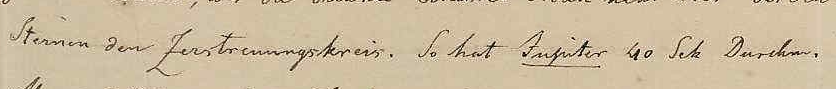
Sternen den Zerstreuungskreis. So hat Jupiter 40 Sek. Durchm.
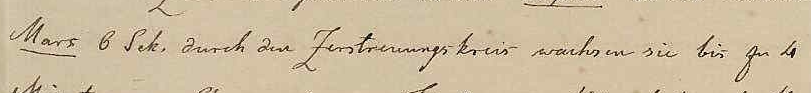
Mars 6 Sek, durch den Zerstreuungskreis wachsen sie bis zu 4
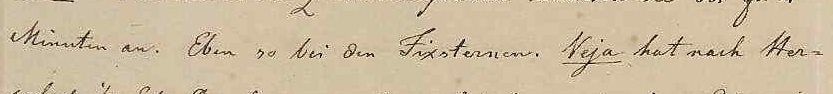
Minuten an. Eben so bei den Fixsternen. Veja hat nach Her-
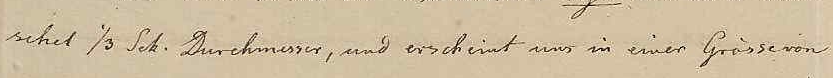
schel ⅓ Sek. Durchmesser, und erscheint uns in einer Grösse von
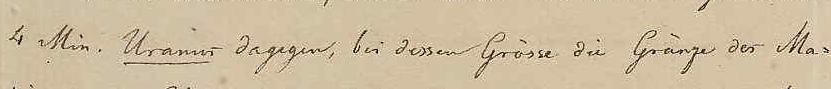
4 Min. Uranus dagegen, bei dessen Grösse die Gränze des Ma-
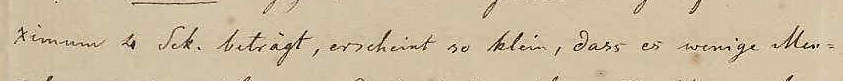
ximum 4 Sek. beträgt, erscheint so klein, dass es wenige Men-
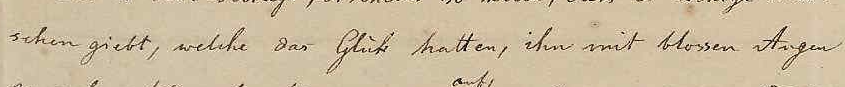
schen giebt, welche das Glück hatten, ihn mit blossen Augen
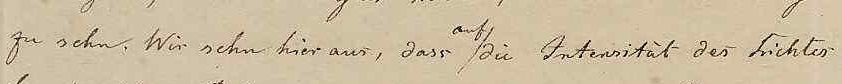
zu sehn. Wir sehn hier aus, dass auf die Intensität des Lichtes
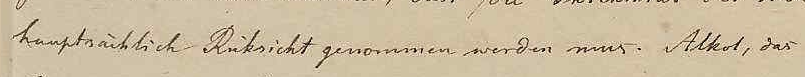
hauptsächlich Rüksicht genommen werden mus. Alkol, das
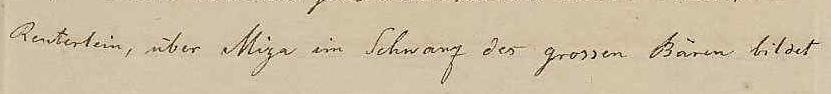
Reuterlein, über Miza im Schwanz des grossen Bären bildet
